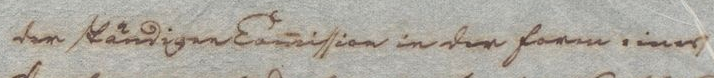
der ständigen Commission in der Form eines
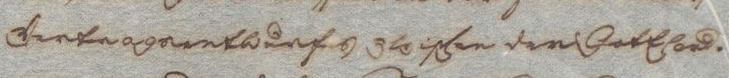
Vertragsentwurfes zwischen der Gotthard -
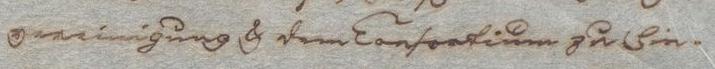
vereinigung & dem Consortium zu hin-
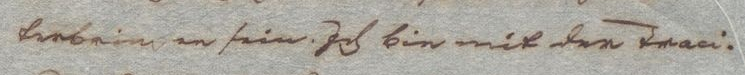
terbringen sein. Ich bin mit der Traci-
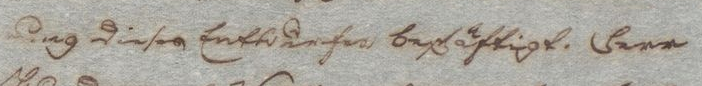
rung dieses Entwurfes beschäftigt. Herr
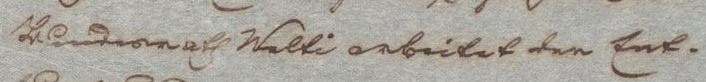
Bundesrath Welti arbeitet den Ent-
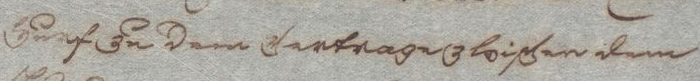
wurf zu dem Vertrage zwischen dem
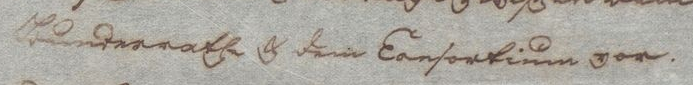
Bundesrathe & dem Consortium vor.
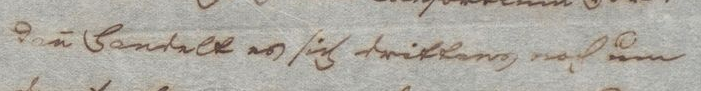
Dann handelt es sich drittens noch um
